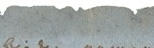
stand
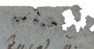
indessen
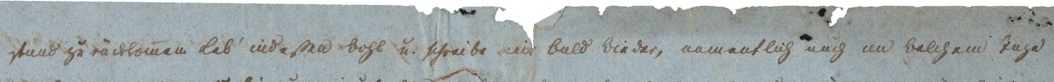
wohl u. schreibe mir bald wieder, namentlich noch an welchem Tage
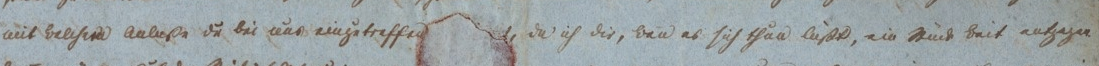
mit welchem Anlasse Du bei uns einzutreffen gedenkst, da ich Dir, wenn es sich thun läßt, ein Stück weit entgegen-
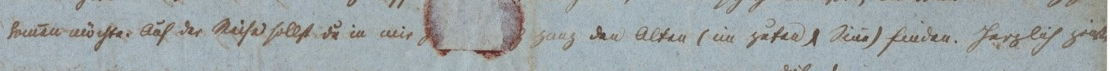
kommen möchte. Auf der Reise sollst Du in mir ... ganz den Alten (im guten Sinne) finden. Herzlich grüßt
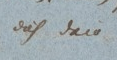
Dich Dein
